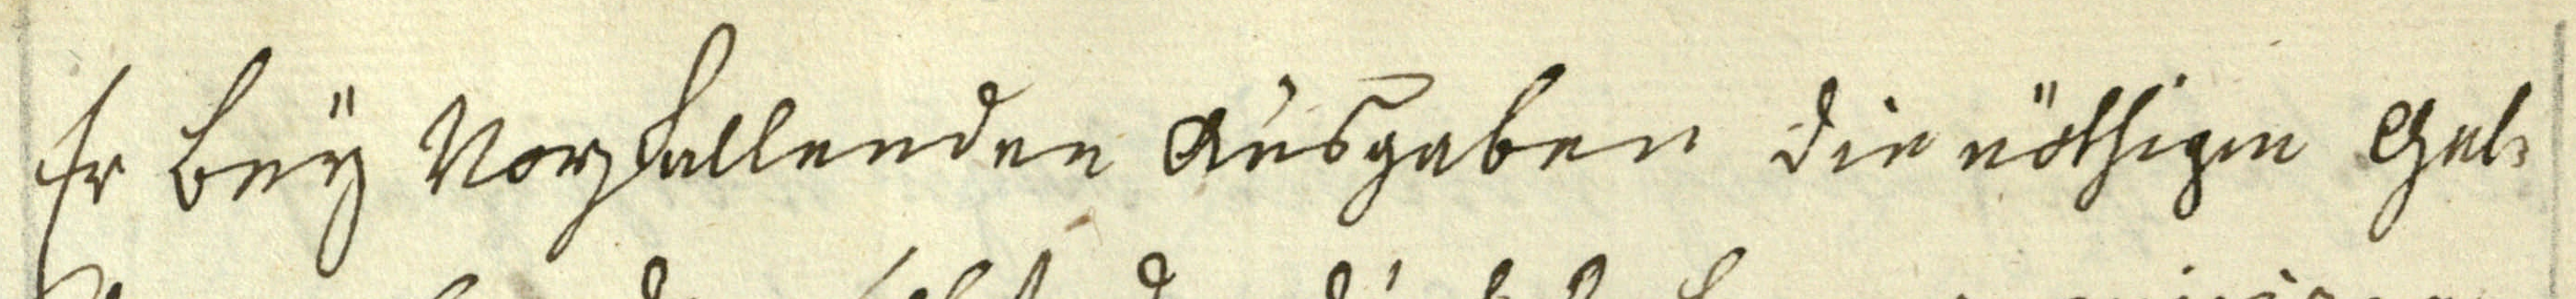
Er beÿ vorfallenden Ausgaben die nöthigen Gel¬
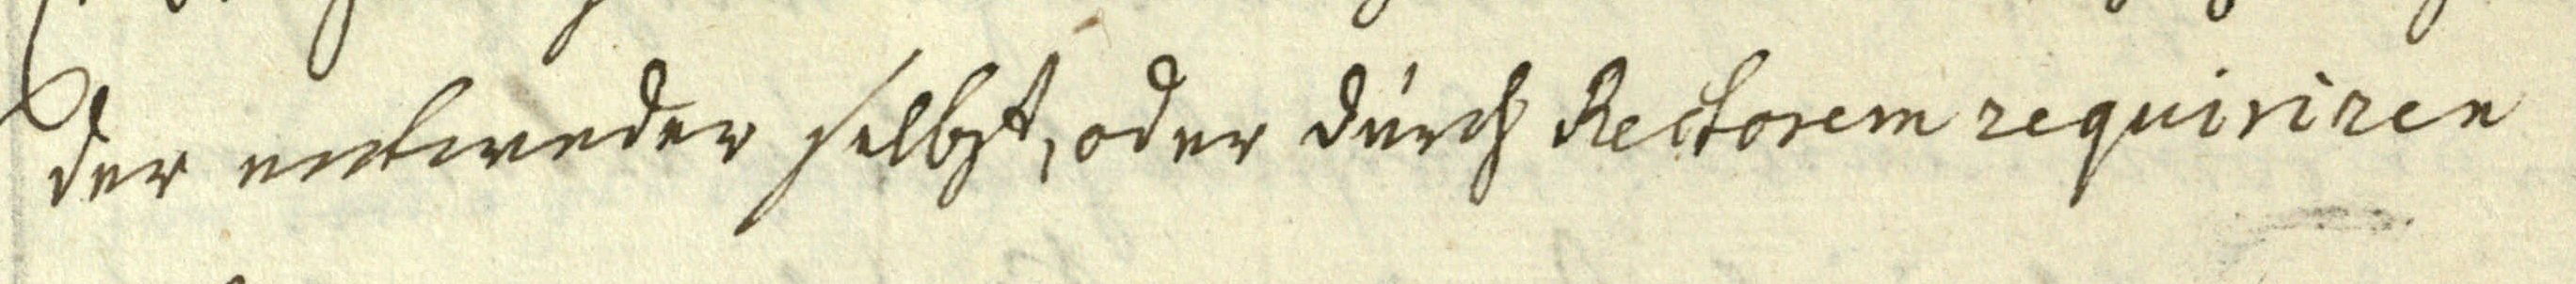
der entweder selbst, oder durch Rectorem requiriren
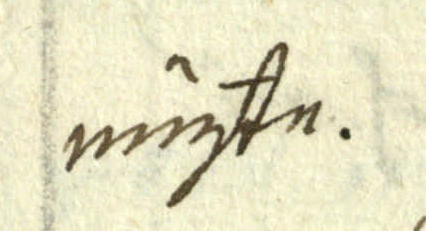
müste.
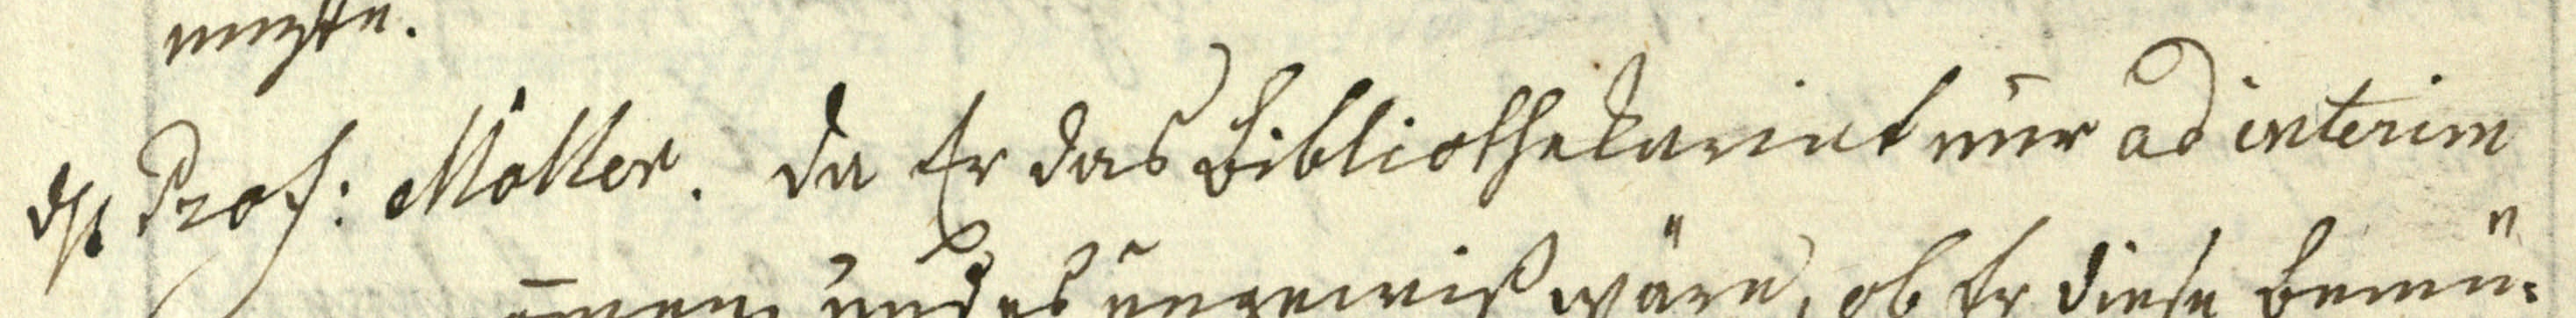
dh Prof. Möller. Da Er das Bibliothekariat nur ad interim
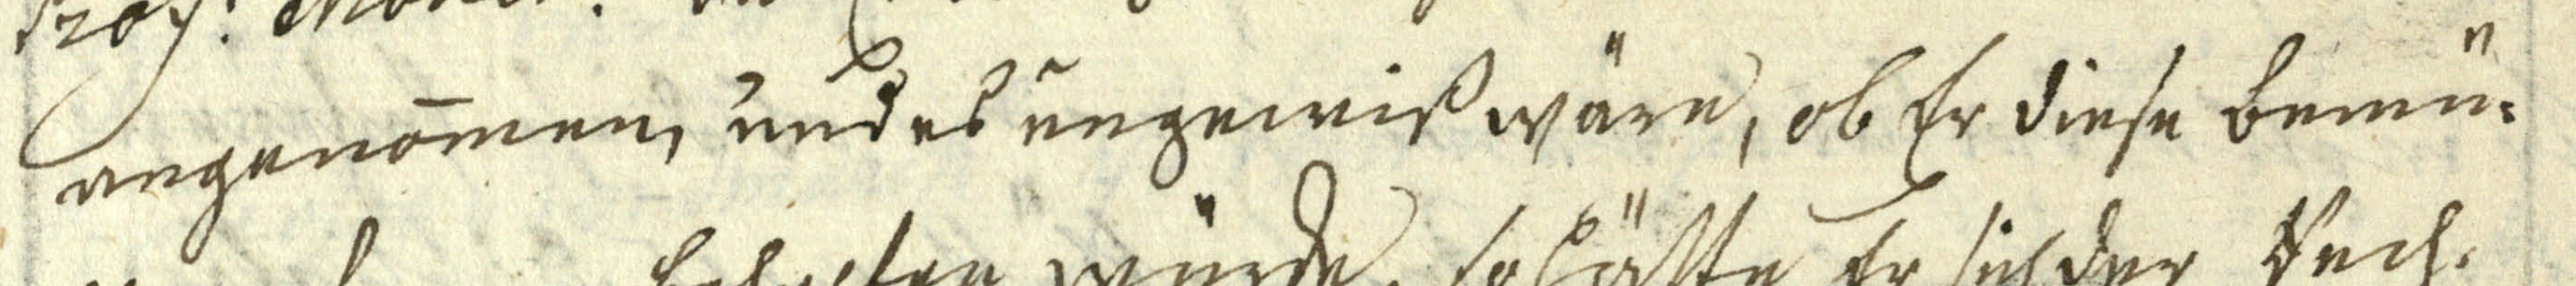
angenomen, und es ungewiß wäre, ob Er diese Bemü¬
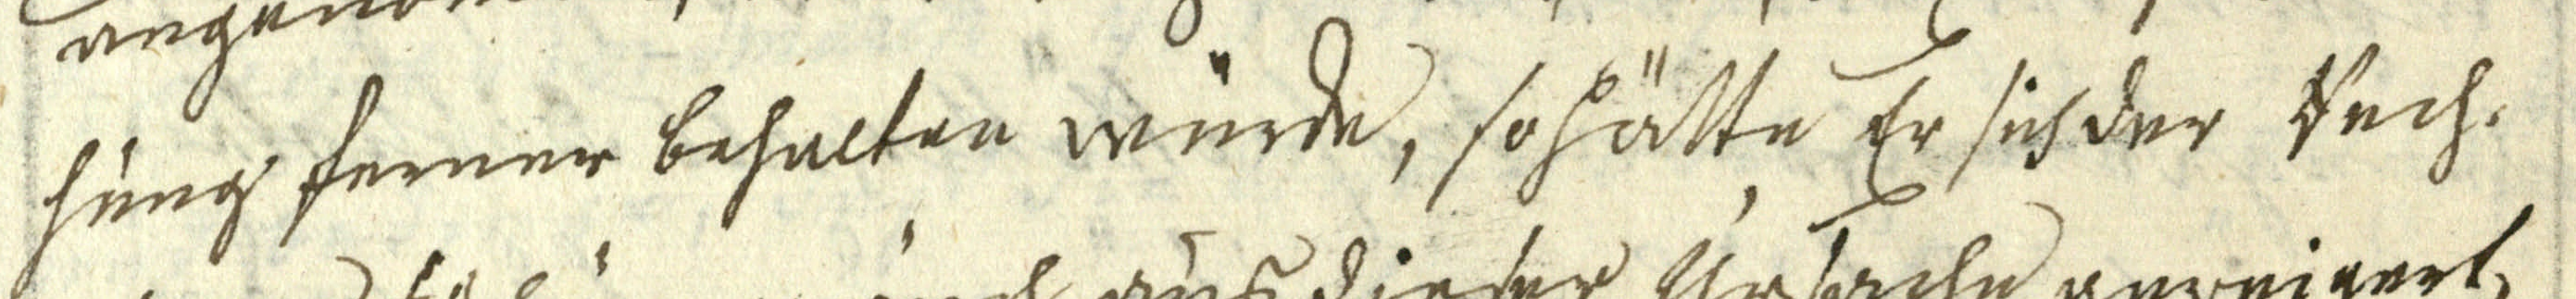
hung ferner behalten würde, so hätte Er sich der Rech¬
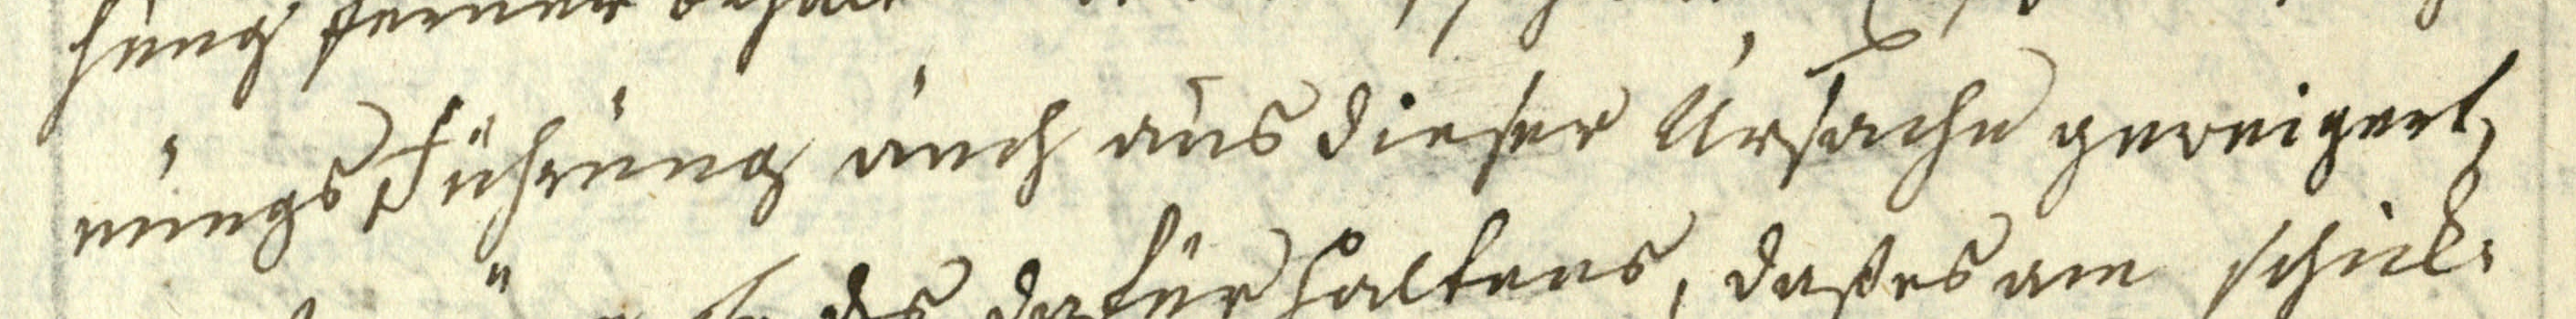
nungs Führung auch aus dieser Ursache geweigert,
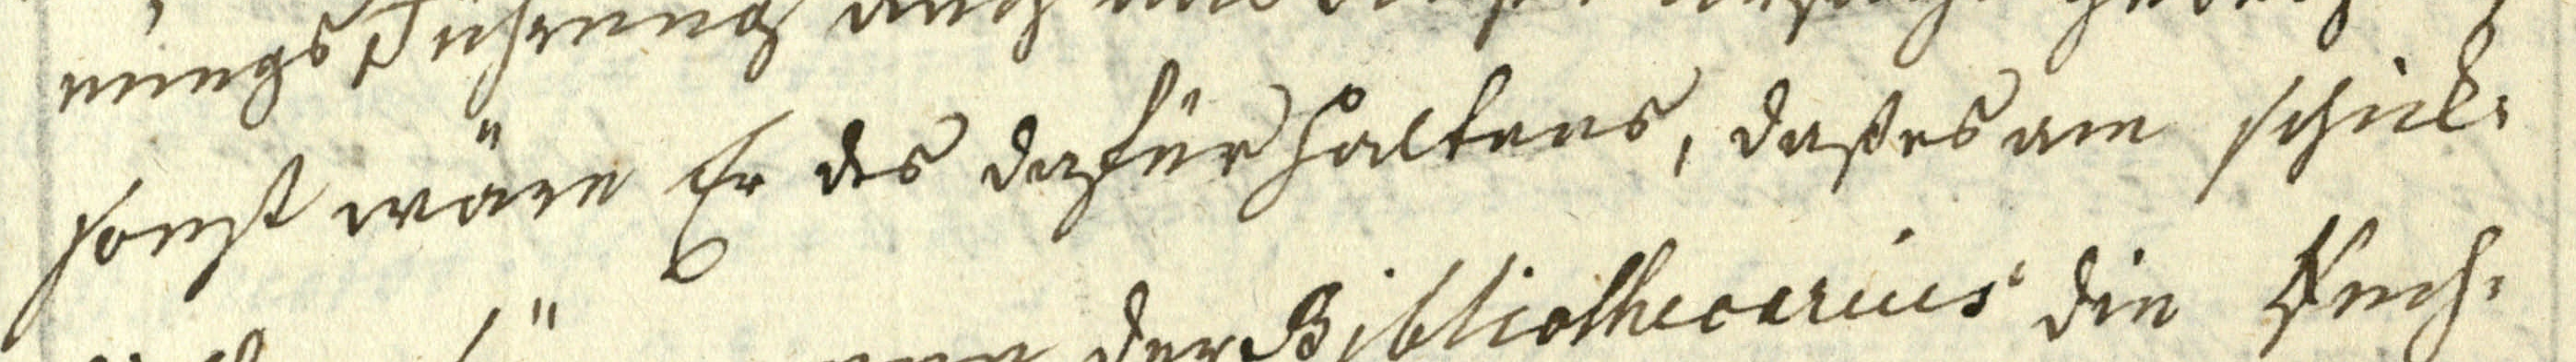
sonst wäre Er des dafürhaltens, daß es am schick¬
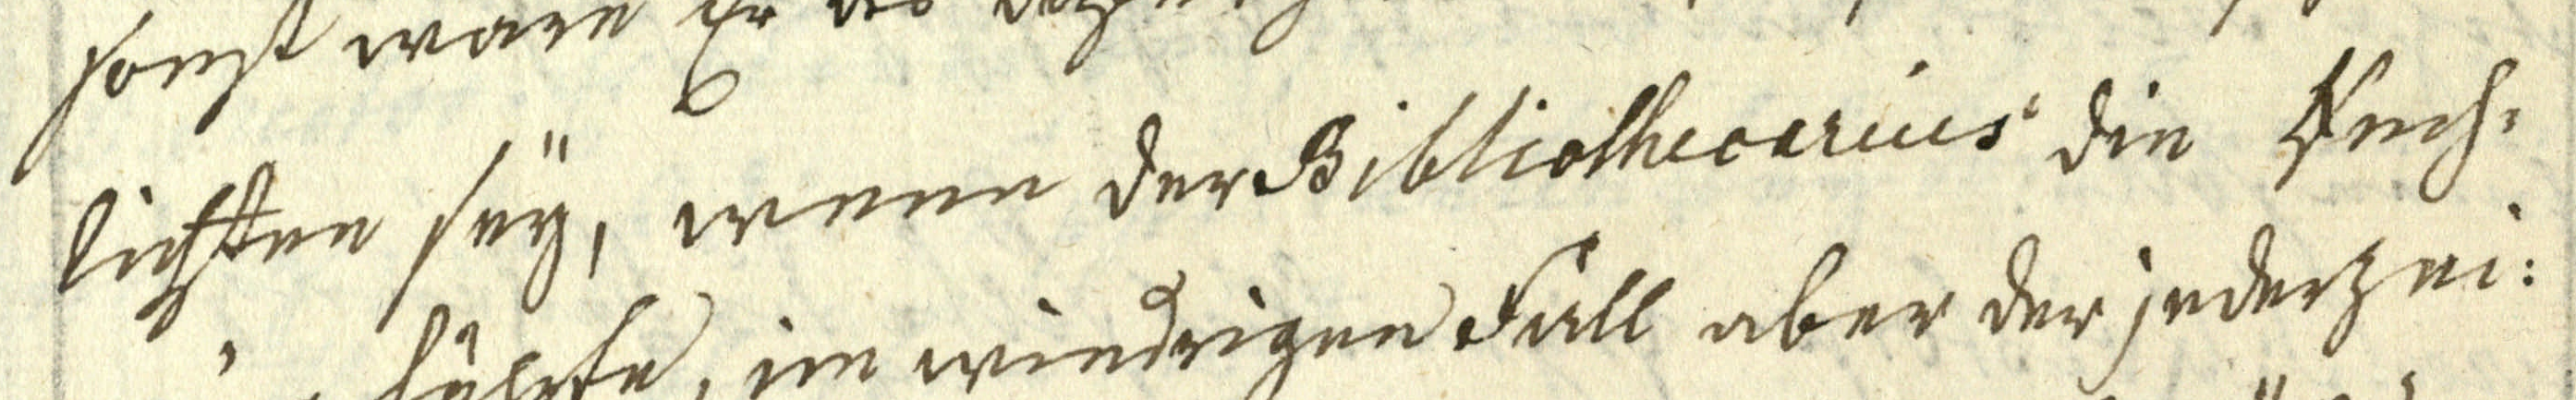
lichsten seÿ, wenn der Bibliothecarius die Rech¬
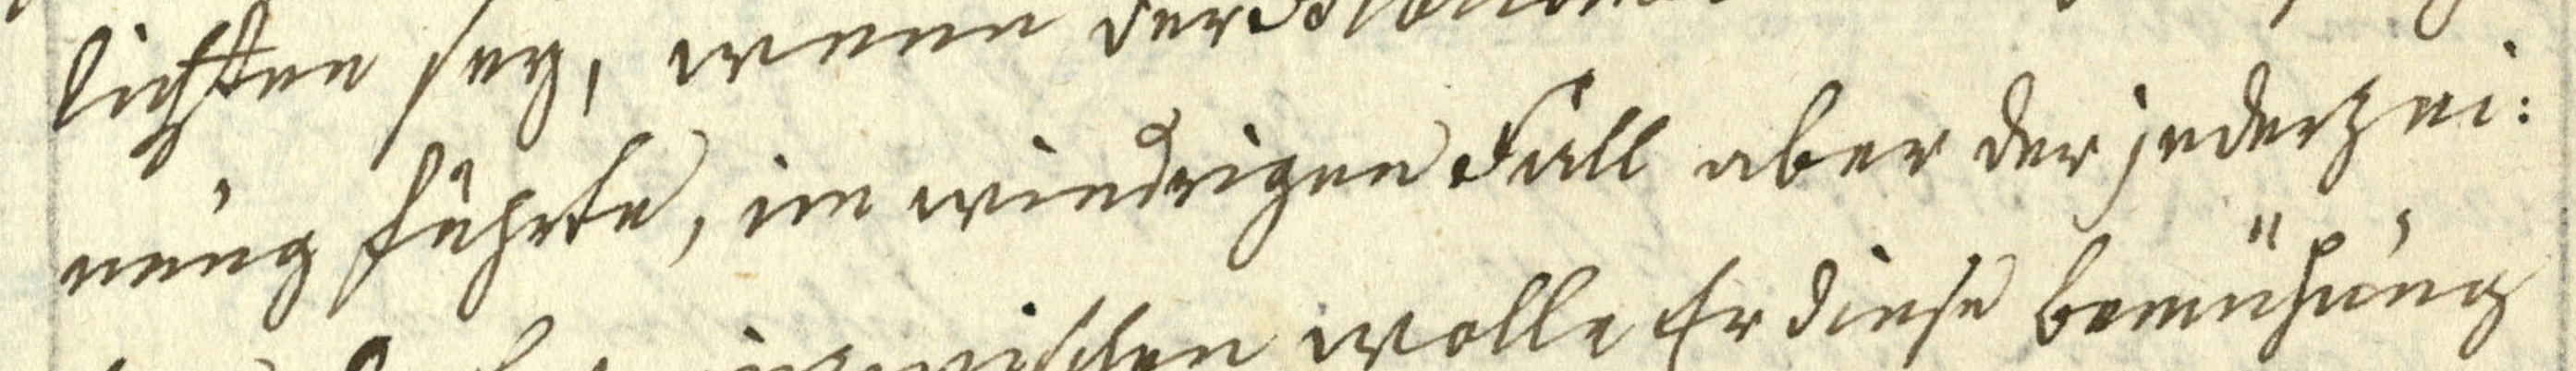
nung führte, in wiedrigen Fall aber der jederzei¬
